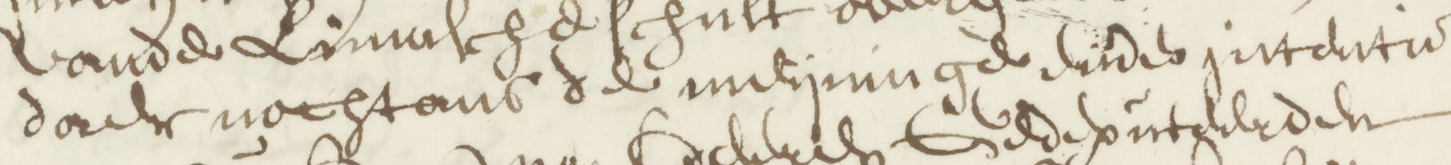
daer nochtans de meijninge ende intentie
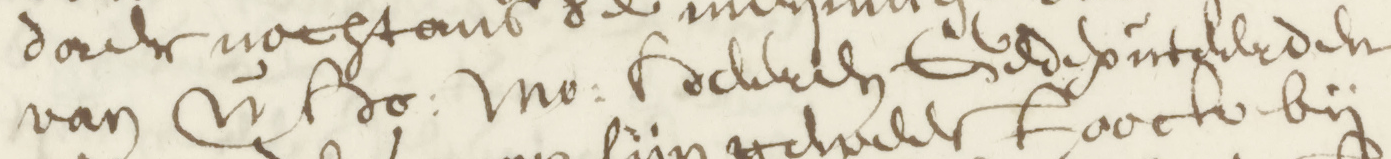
van U Ho:Mo: Heeren Gedeputeerden
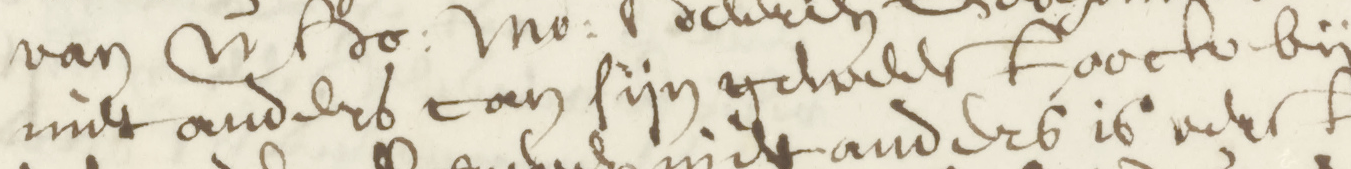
niet anders can sijn geweest, oock bij
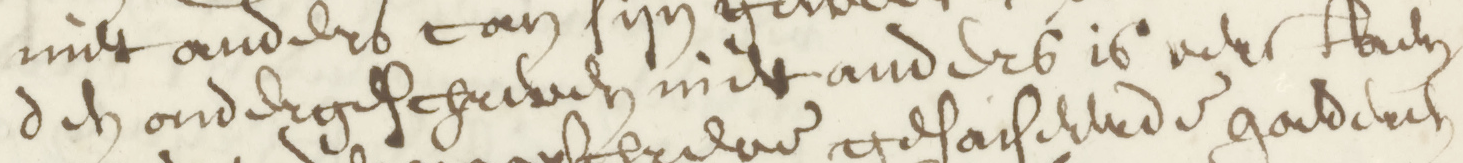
den ondergeschreven niet anders is verstaen
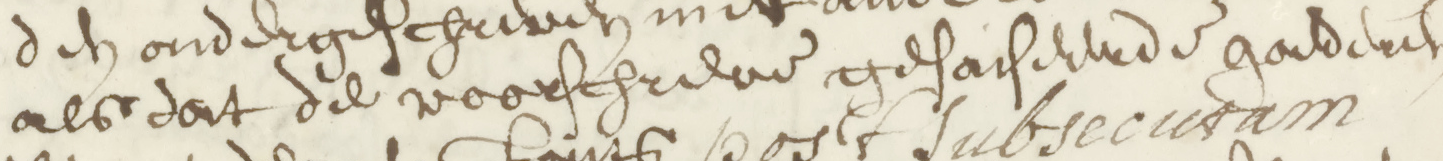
als dat de voorschreve gesaiseerde goederen
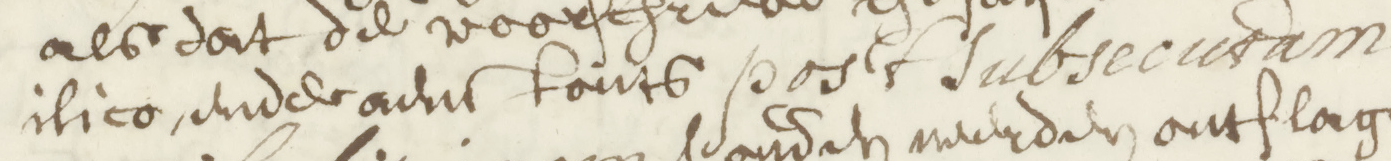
ilico, ende aenstonts post subsecutam
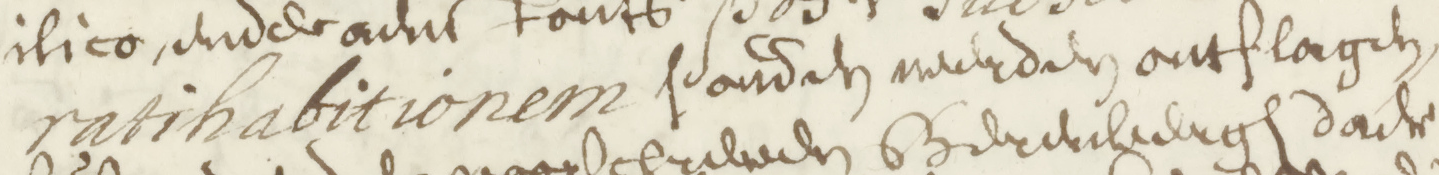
ratihabitionem souden werden ontslagen,
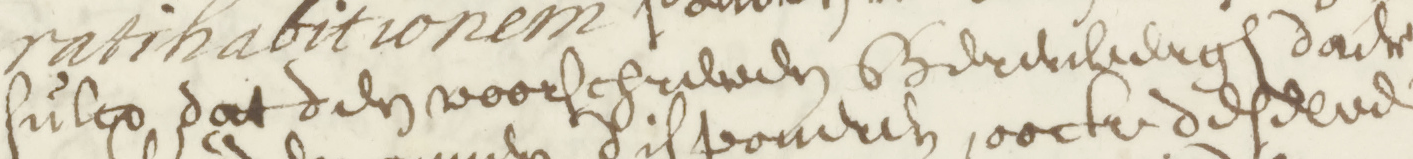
sulcx dat den voorschreven Berenbergh daer
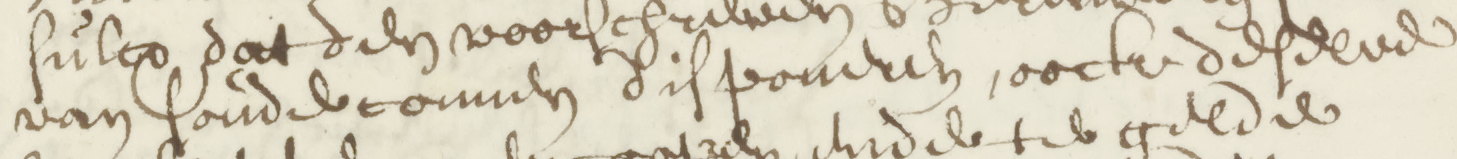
van soude connen disponeren, oock deselve
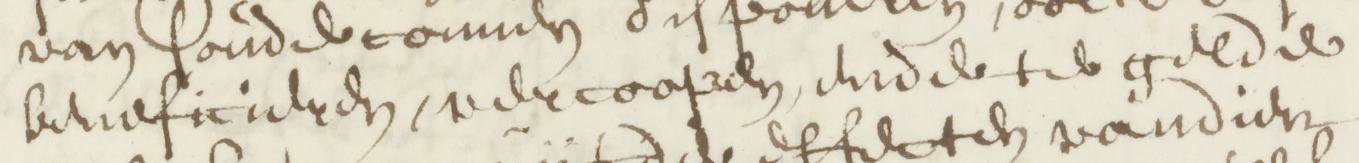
beneficieren, vercoopen, ende te gelde
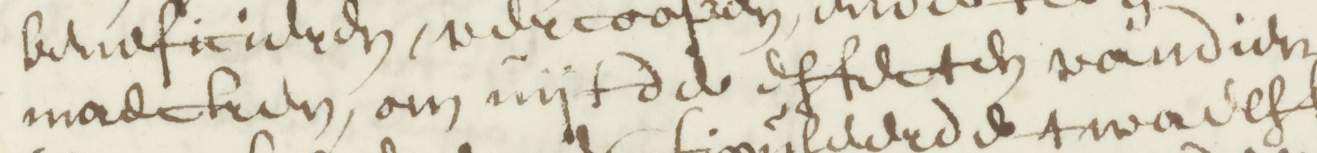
maecken, om uijt de effecten vandien
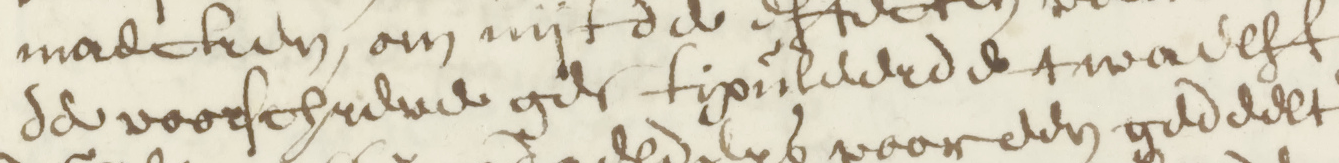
de voorschreve gestipuleerde twaelff
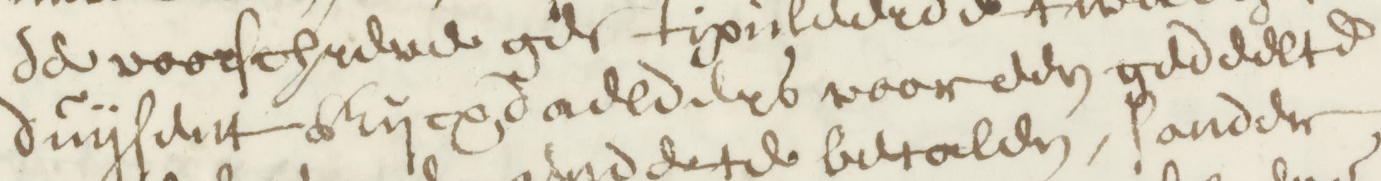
duijsent Rijcxdaelders voor een gedeelte
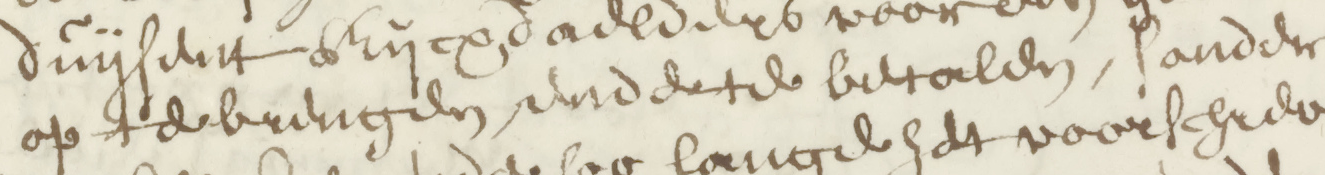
op te brengen, ende te betalen, sonder
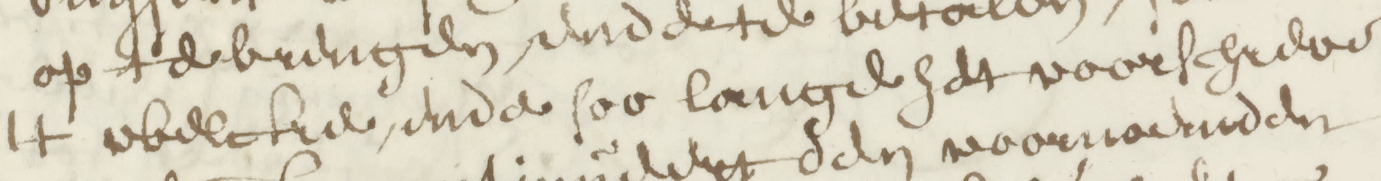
‛t welcke, ende soo lange het voorschreve
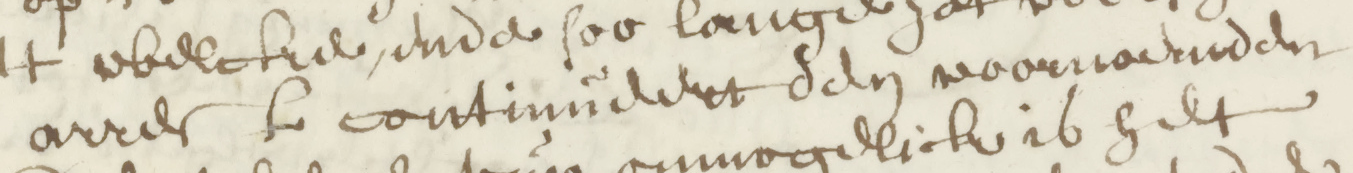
arrest continueert den voornoemden
